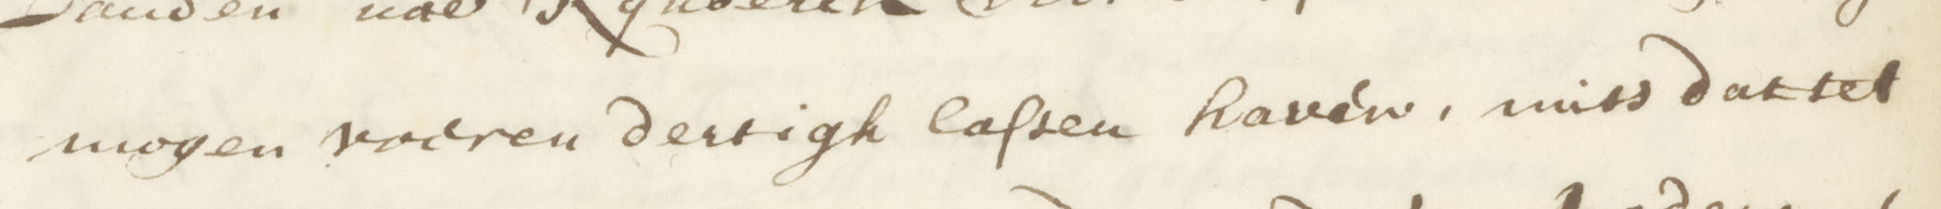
mogen voeren dertigh lasten haver, mits dattet
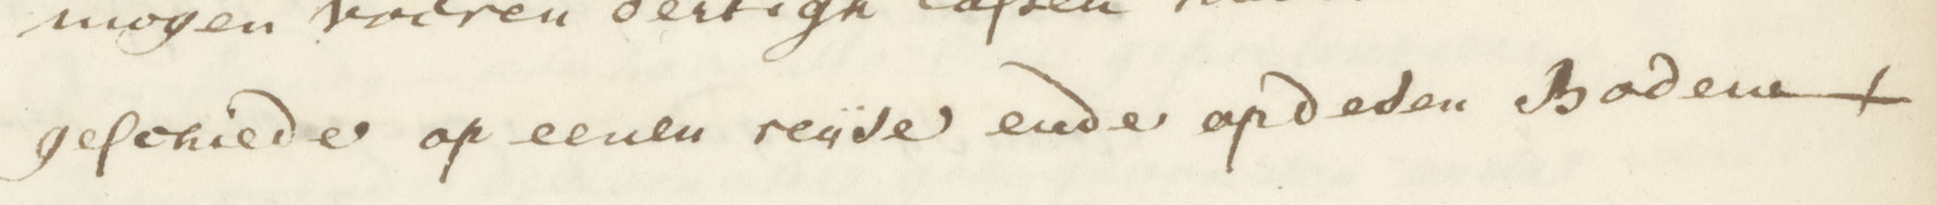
geschiede op eenen reijse ende op desen Bodem+
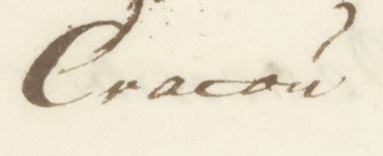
Cracau
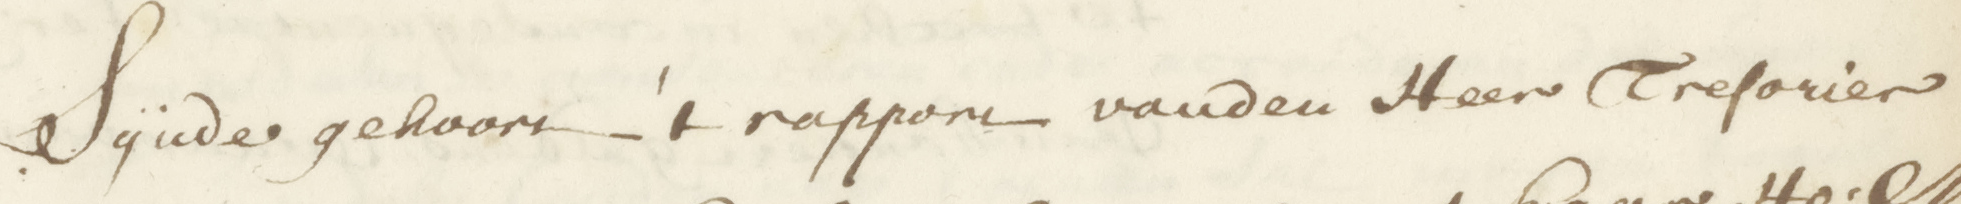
Sijnde gehoort 't rapport vanden Heer Tresorier
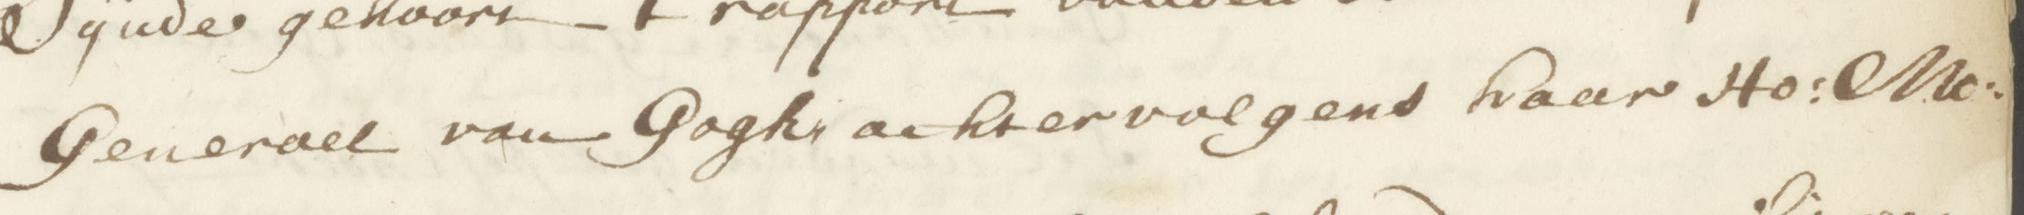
Generael van Gogh, achtervolgens haar Ho:Mo:
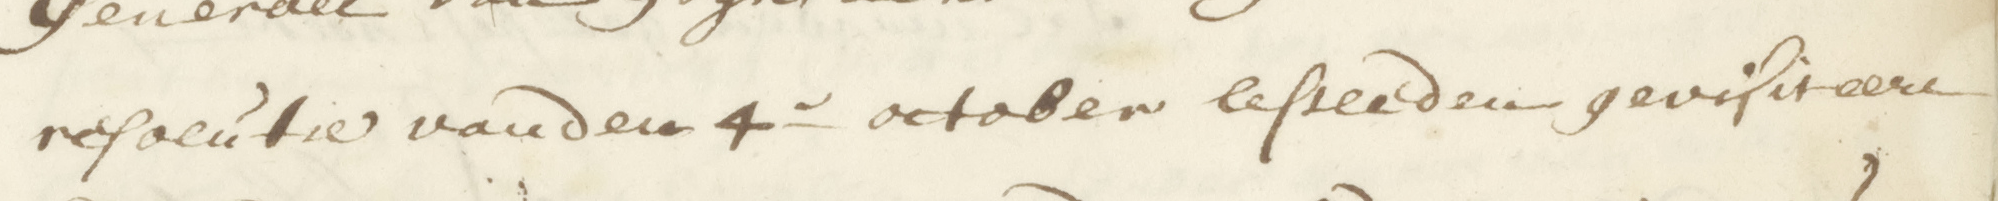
resolutie vanden 4e october lestleden gevisiteert
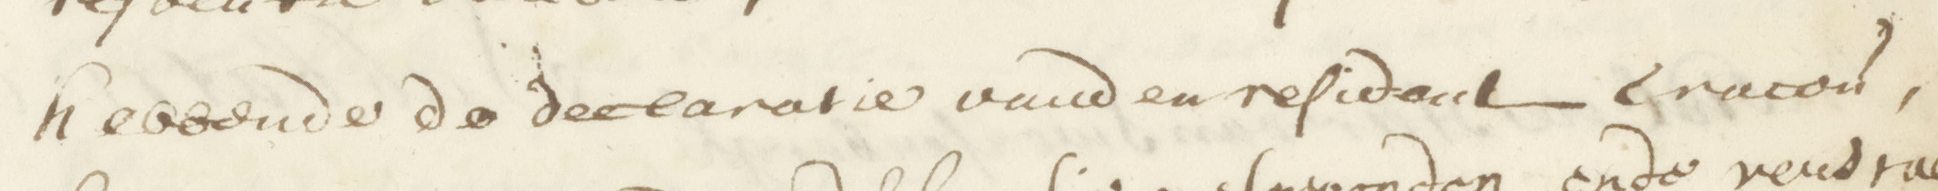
hebbende de declaratie vanden resident cracou,
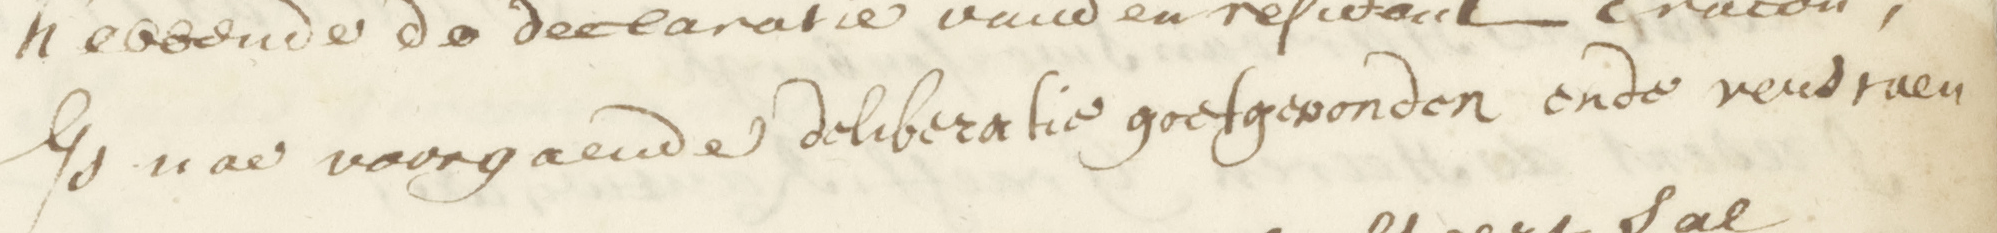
Is nae voorgaende deliberatie goetgevonden ende verstaen
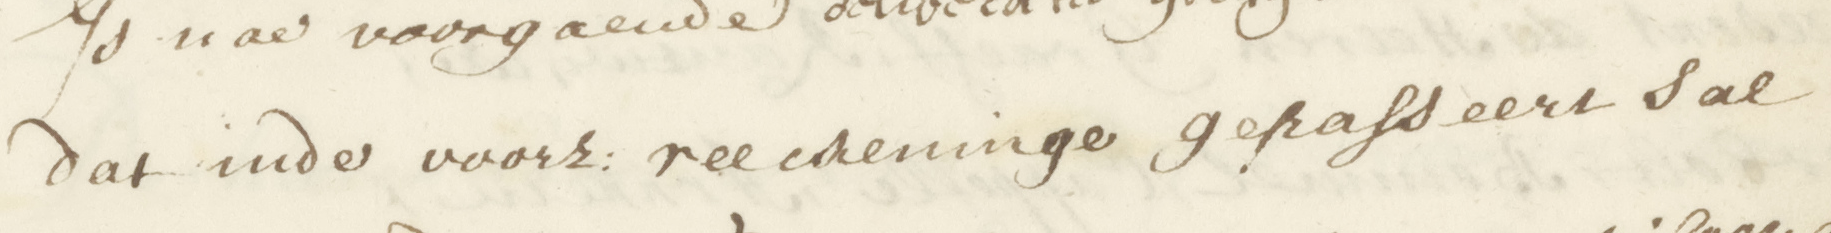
dat inde voorz: reeckeninge gepasseert sal
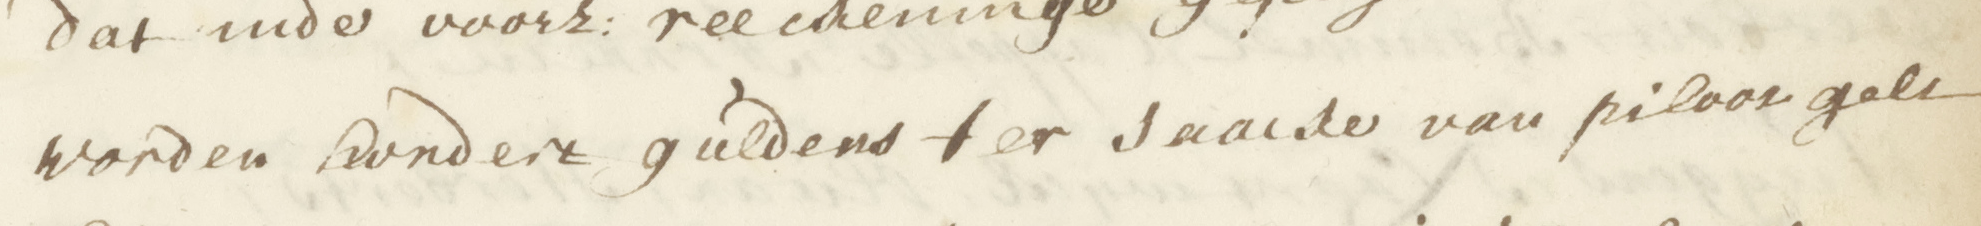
worden hondert guldens ter saacke van pilootgelt
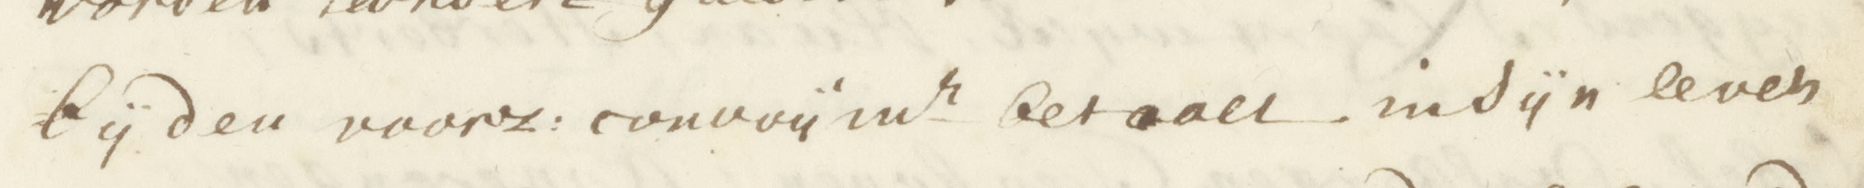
bij den voorz: convoijmr betaalt in sijn leven
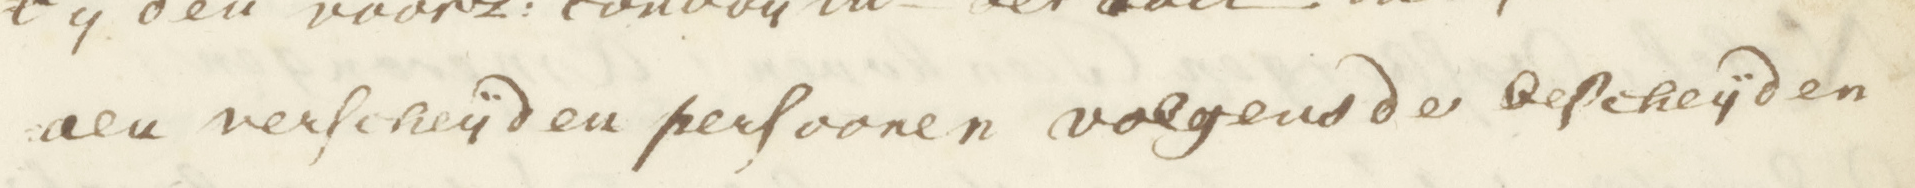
aen verscheijden persoonen volgens de bescheijden
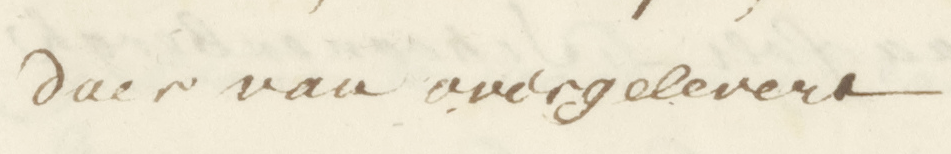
daer van overgelevert
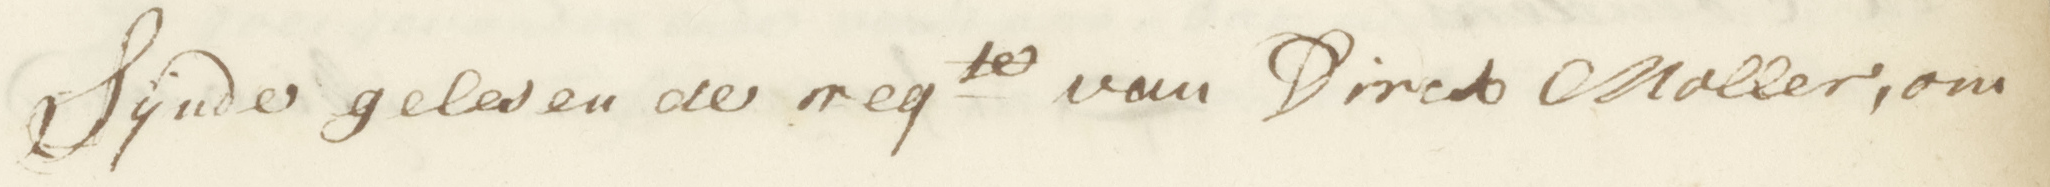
Sijnde gelesen de reqte van Dirck Moller, om
